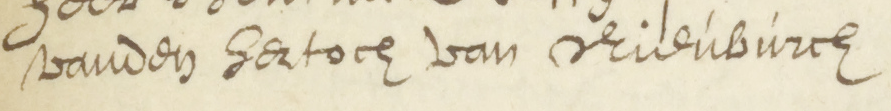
vanden hertoch van Nieuburch
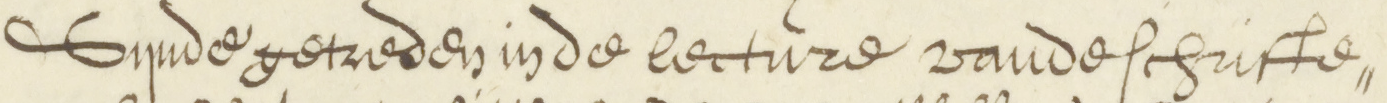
Synde getreden in de lecture vande schrifte,,
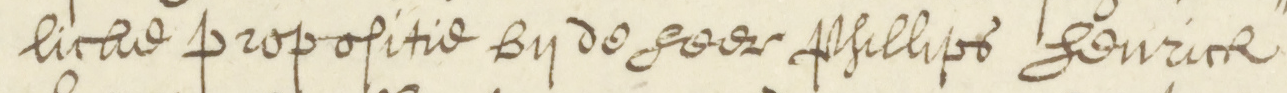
licke propositie by de heer Phillips Henrick
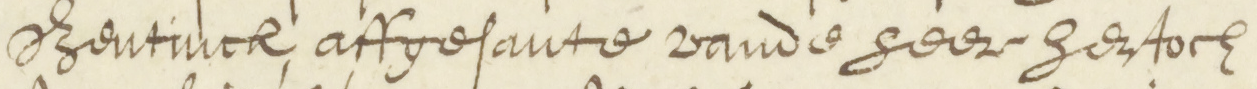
Bentinck affgesante vande heer hertoch
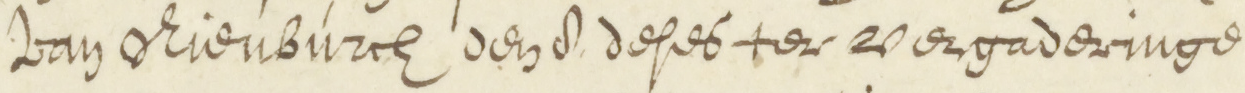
van Nieuburch den 8. deses ter Vergaderinge
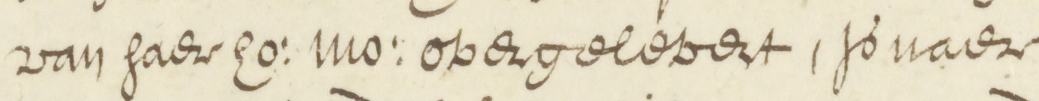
van haer ho:mo: overgelevert, is naer
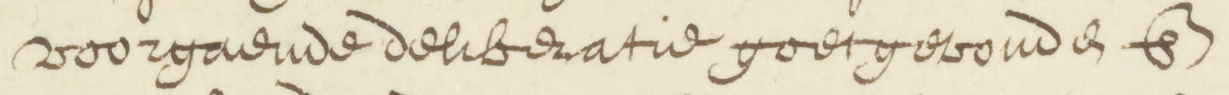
voorgaende deliberatie goetgevonden &
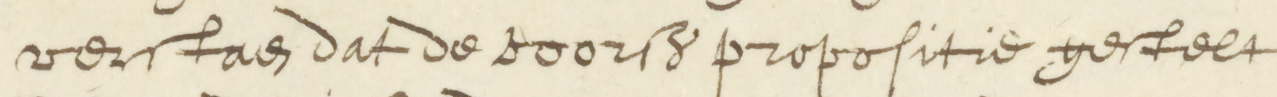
verstaen dat de voors propositie gestelt
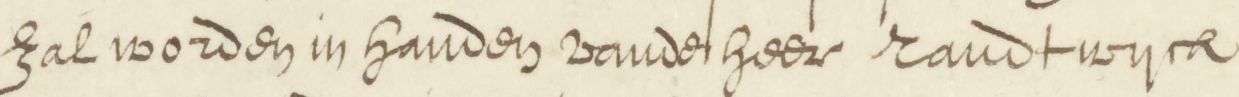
zal worden in handen vande heer randtwyck
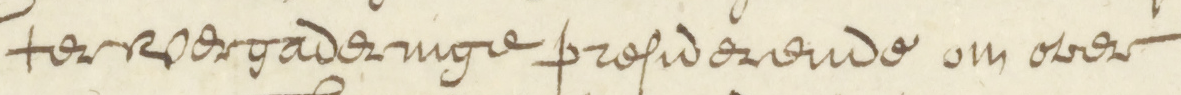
ter Vergaderinge presiderende om over
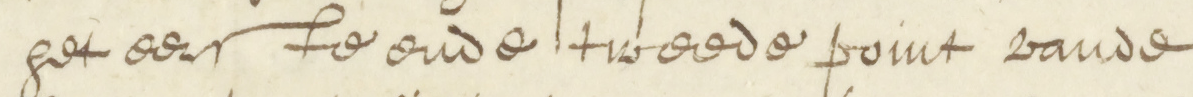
het eerste ende tweede point vande
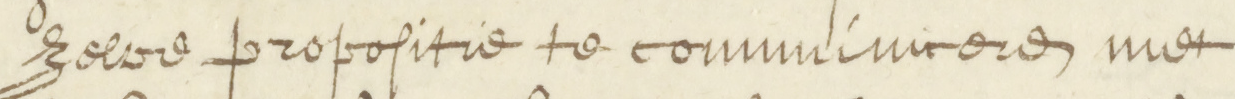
zelve propositie te communiceren met
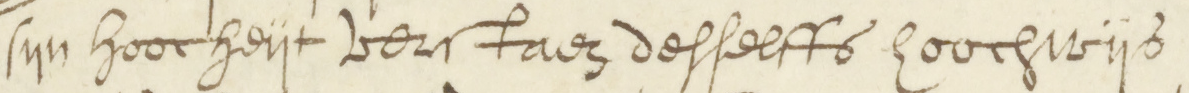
syn hoocheijt verstaen desselffs hoochwijs
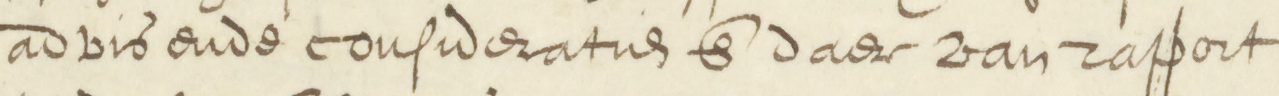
advis ende consideratien & daer van rapport
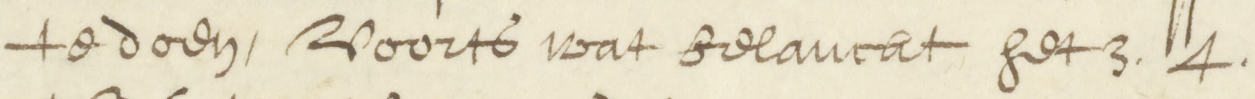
te doen. Voorts wat belanckt het 3. 4.
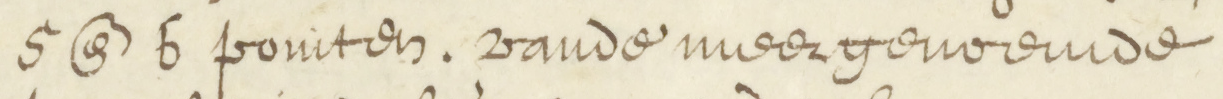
5 & 6 pointen, vande meergenoemde
